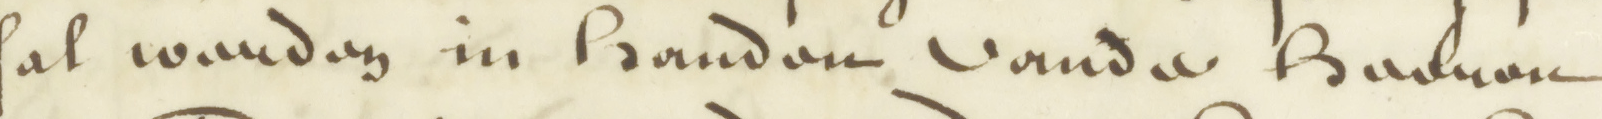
sal werden in handen vande Heeren
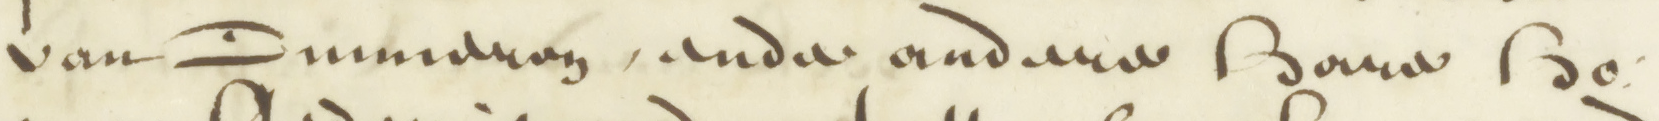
van Ommeren, ende andere Hare Ho:
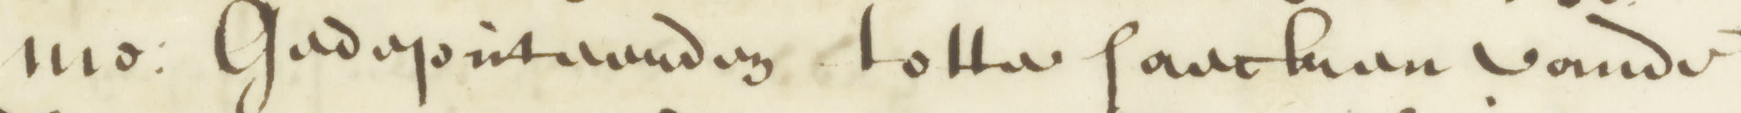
Mo: Gedeputeerden totte saecken vande
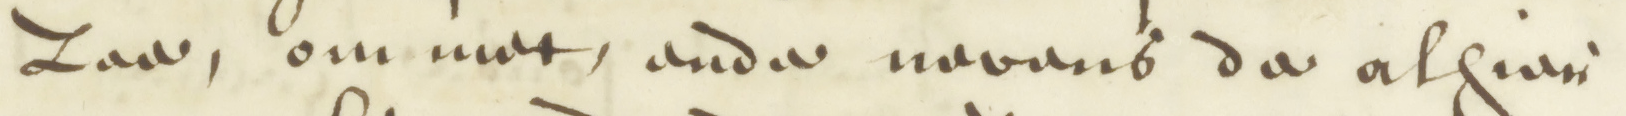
Zee, om met, ende nevens de alhier
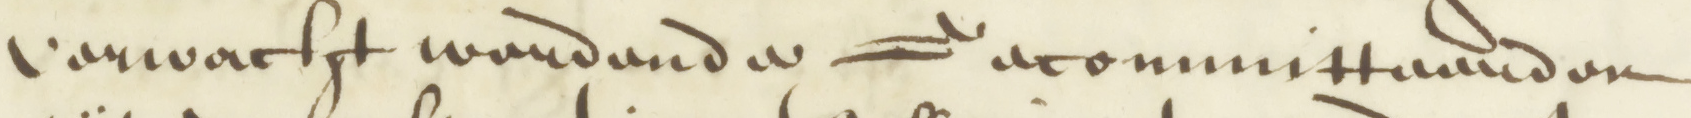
verwacht wordende Gecommitteerden
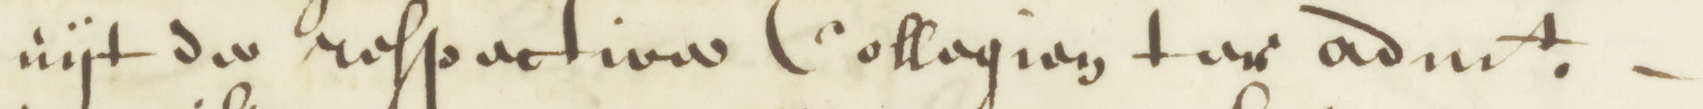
uijt de respective Collegien ter Admt -
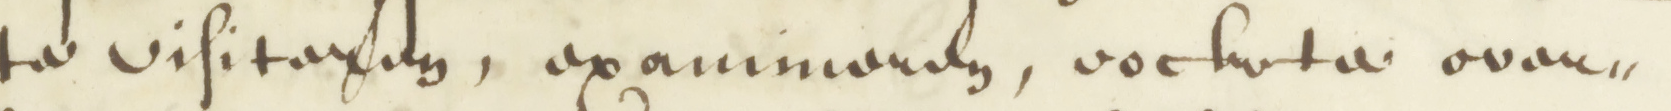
te visiteren, examineren, oock te over„
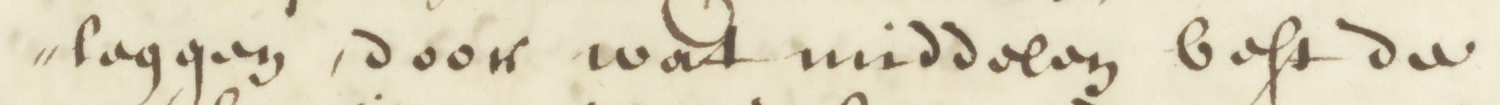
,,leggen, door wat middelen best de
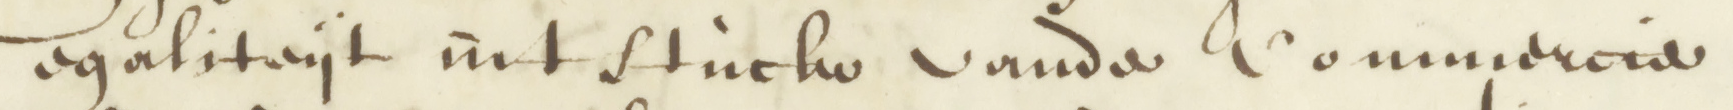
egaliteijt int Stuck vande Commercie
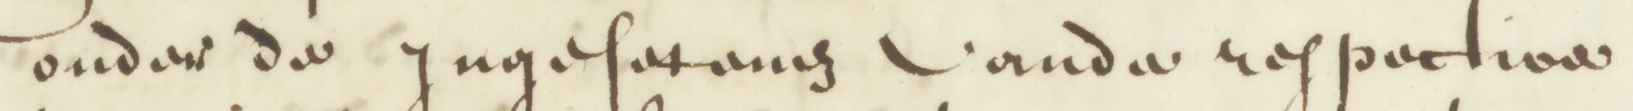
onder de Ingesetenen vande respective
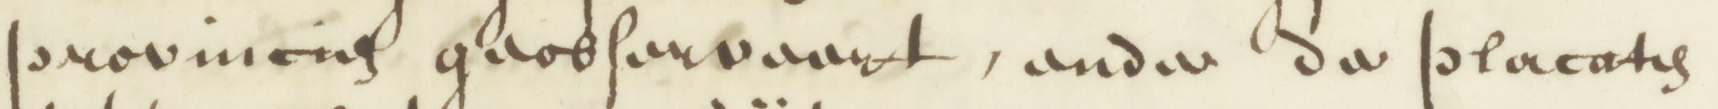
provincie geobserveert, ende de placaten
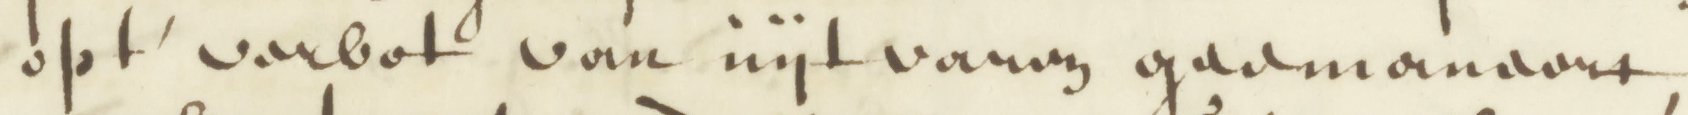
opt‛ verbot van uijtvaren geemaneert,
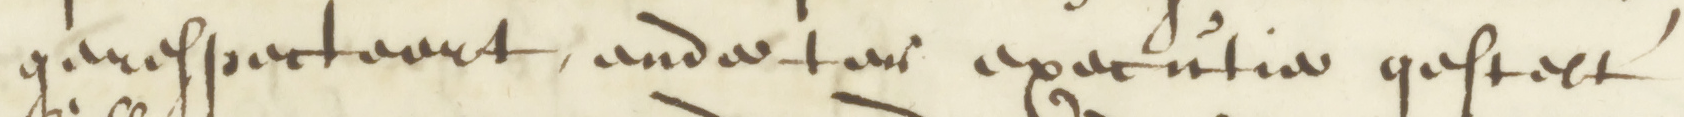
gerespecteert, ende ter executie gestelt
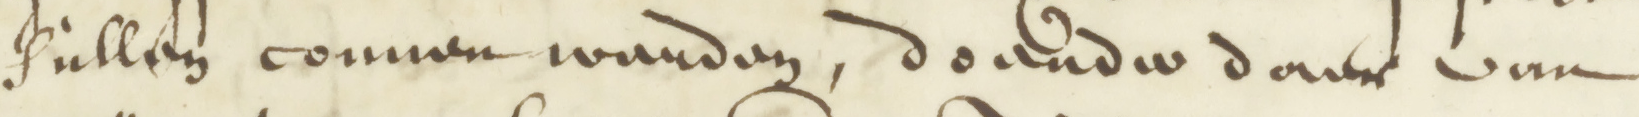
sullen connen werden, doende daer van
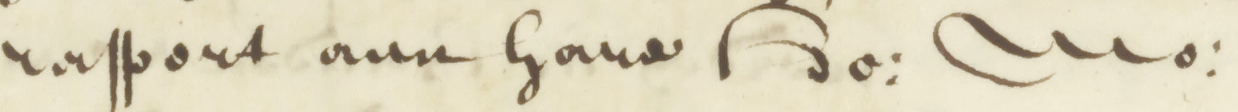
rapport aen hare Ho:Mo:
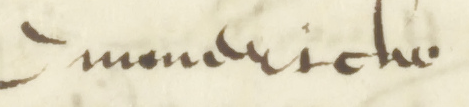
Emmerick
